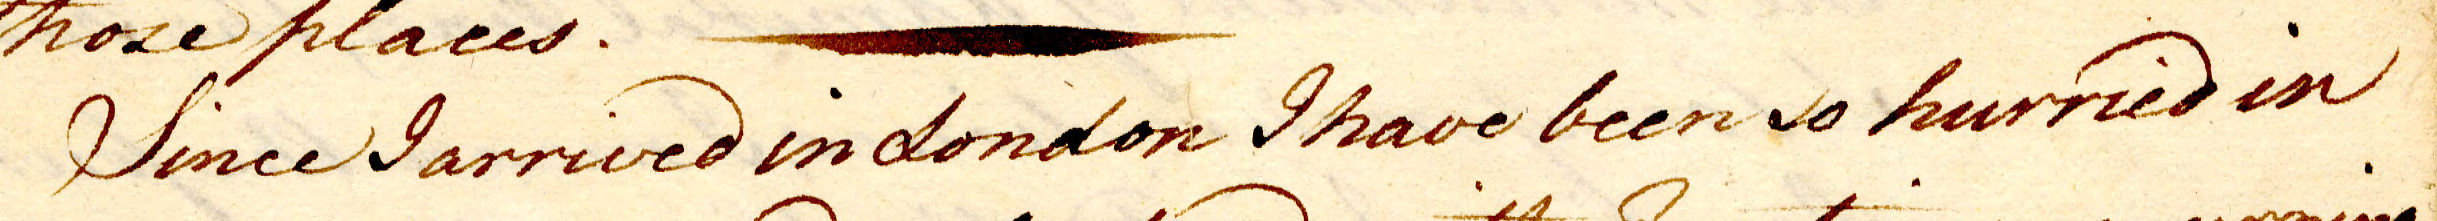Since I arrived in London I have been so hurried in
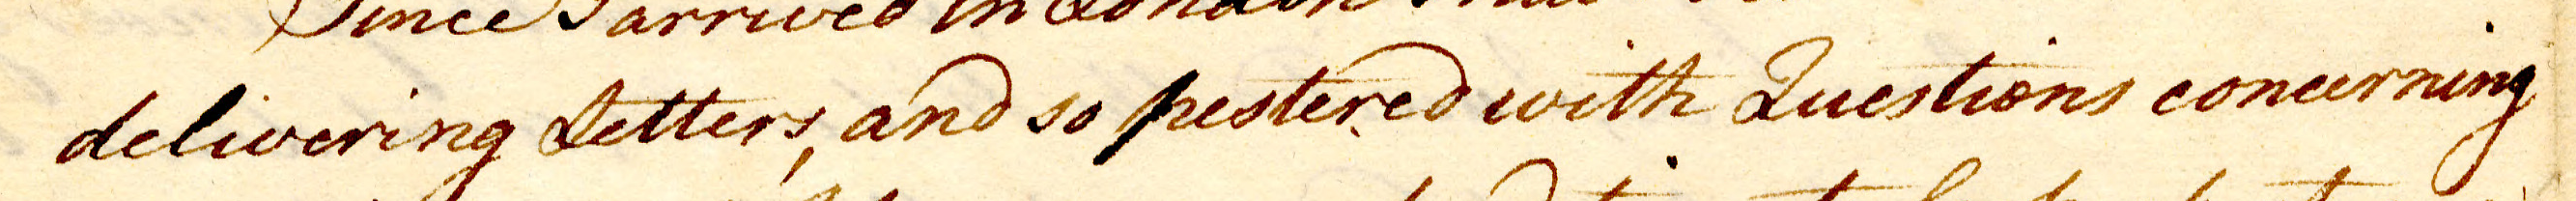delivering Letters, and so pestered with Questions concerning
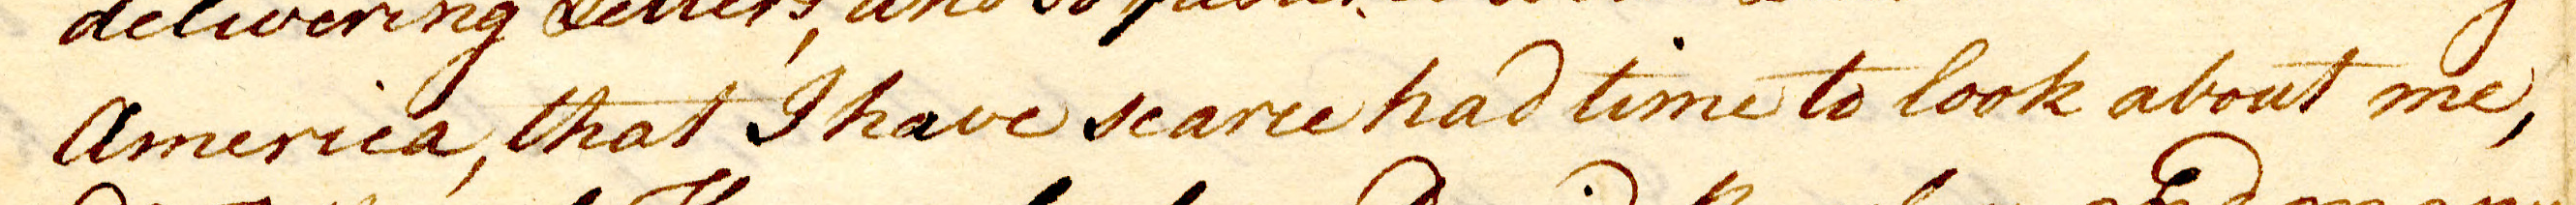America, that I have scarce had time to look about me,
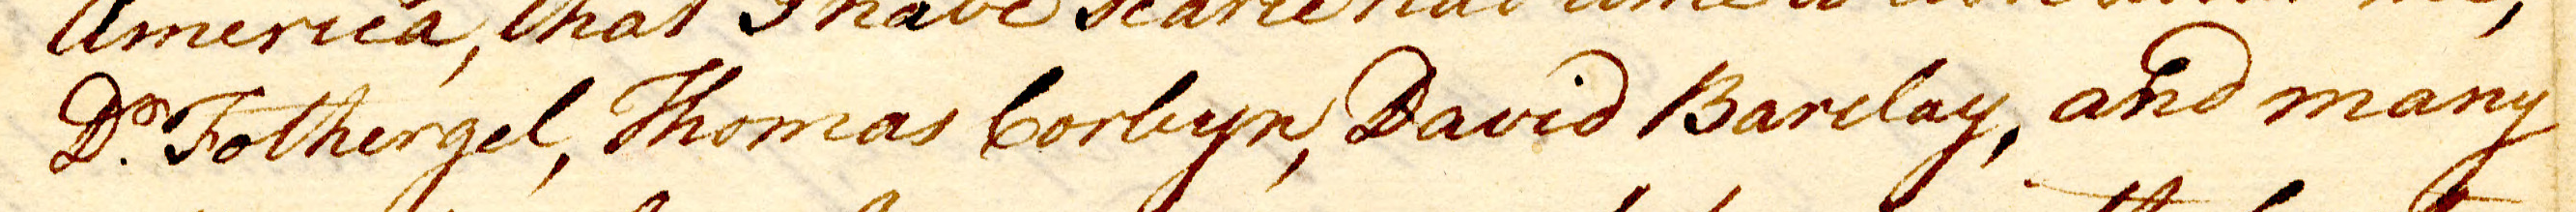D^r. Fothergel, Thomas Corbyn, David Barclay, and many
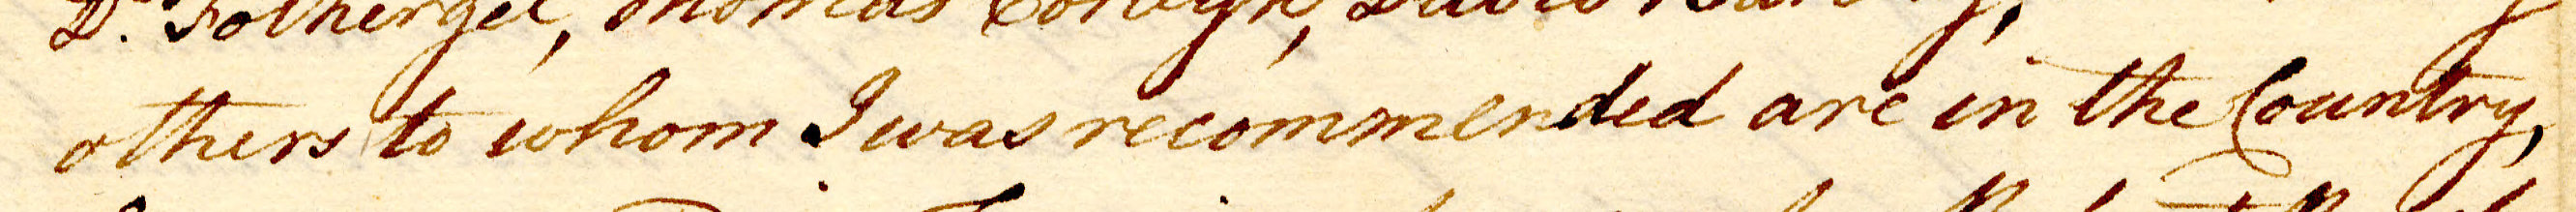others to whom I was recommended are in the Country,
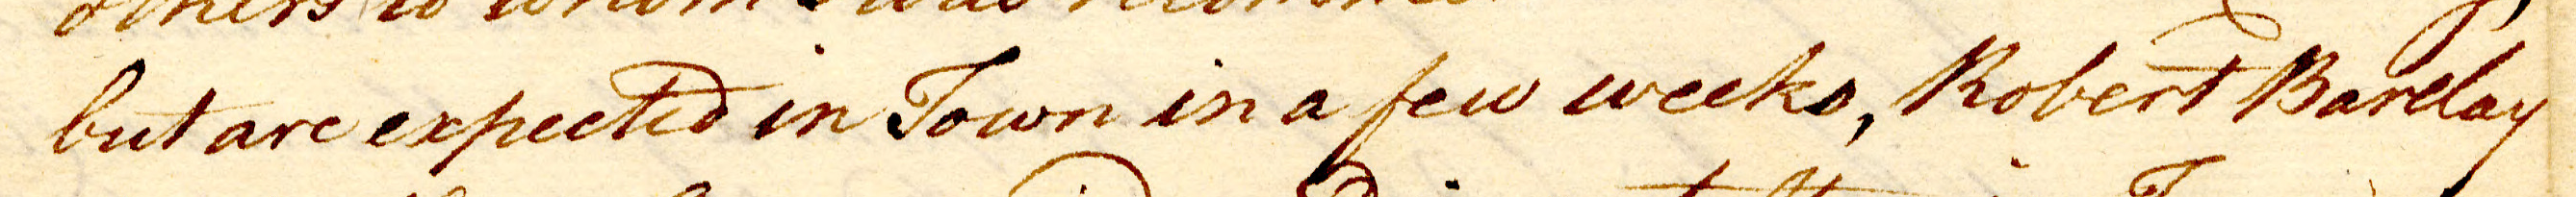but are expected in Town in a few weeks, Robert Barclay
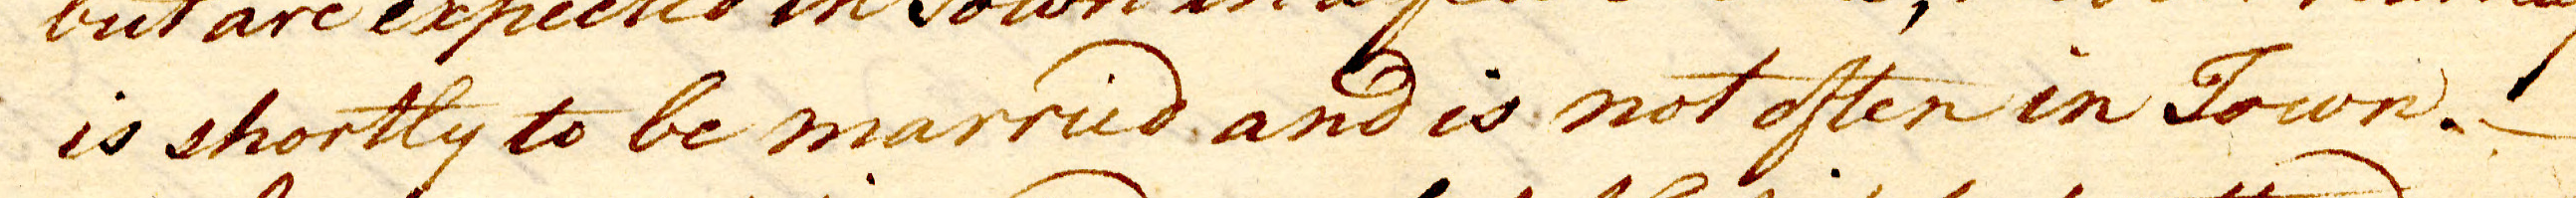is shortly to be married and is not often in Town.-
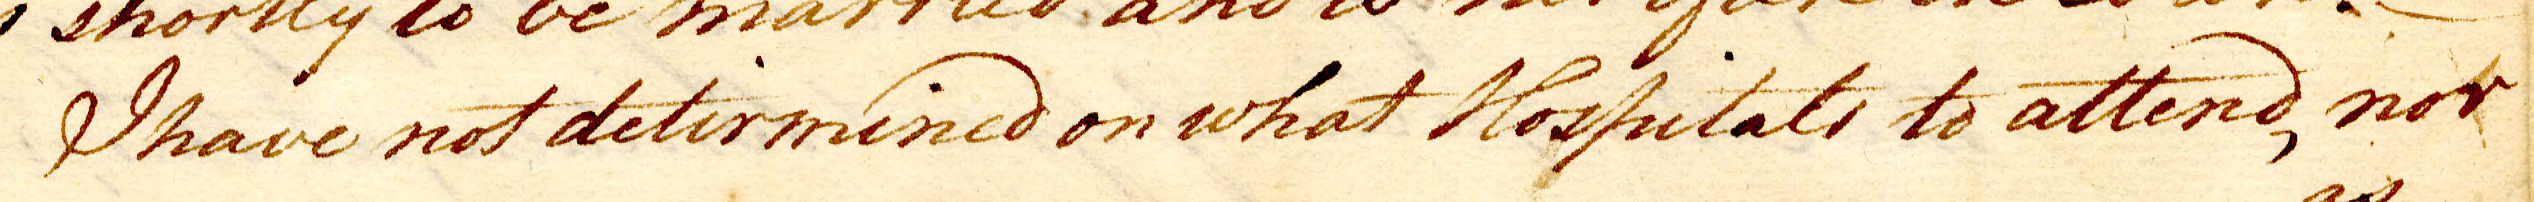I have not determined on what Hospitals to attend, nor
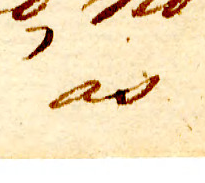as
